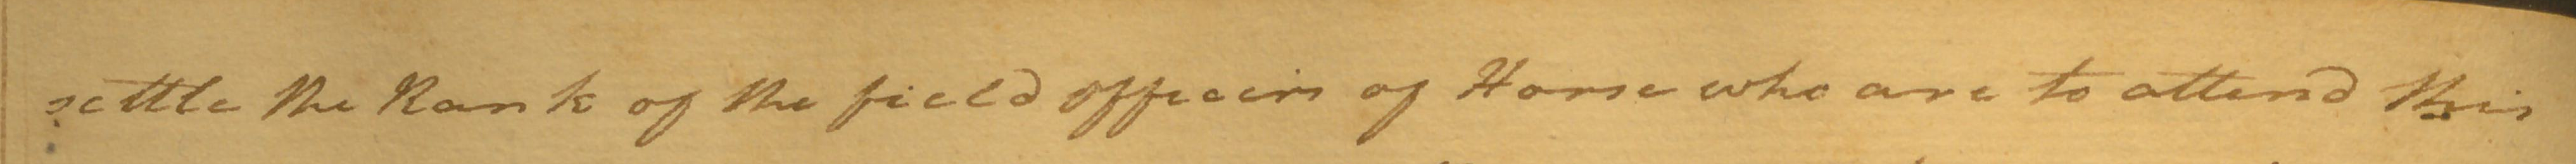settle the Rank of the field officers of Horse who are to attend this
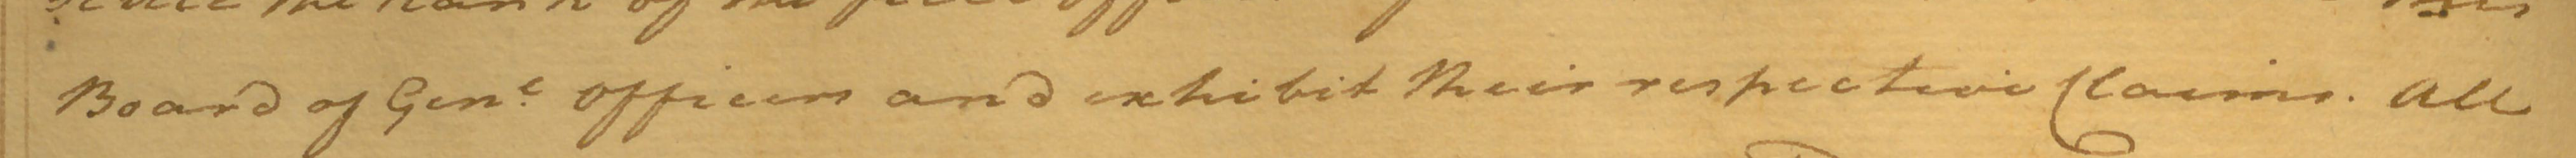Board of Gen^l. officers and exhibit their respective Claims. All
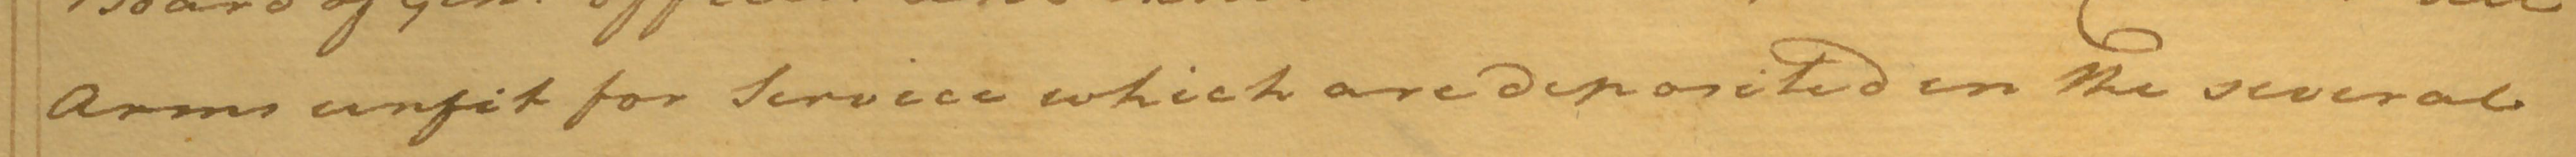Arms unfit for service which are deposited in the several
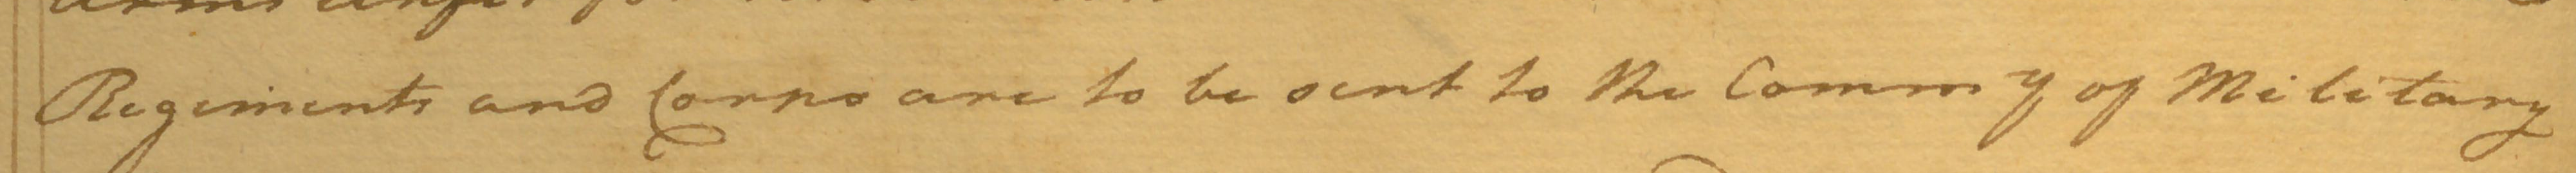Regiments and Corps are to be sent to the Comm^y of Military
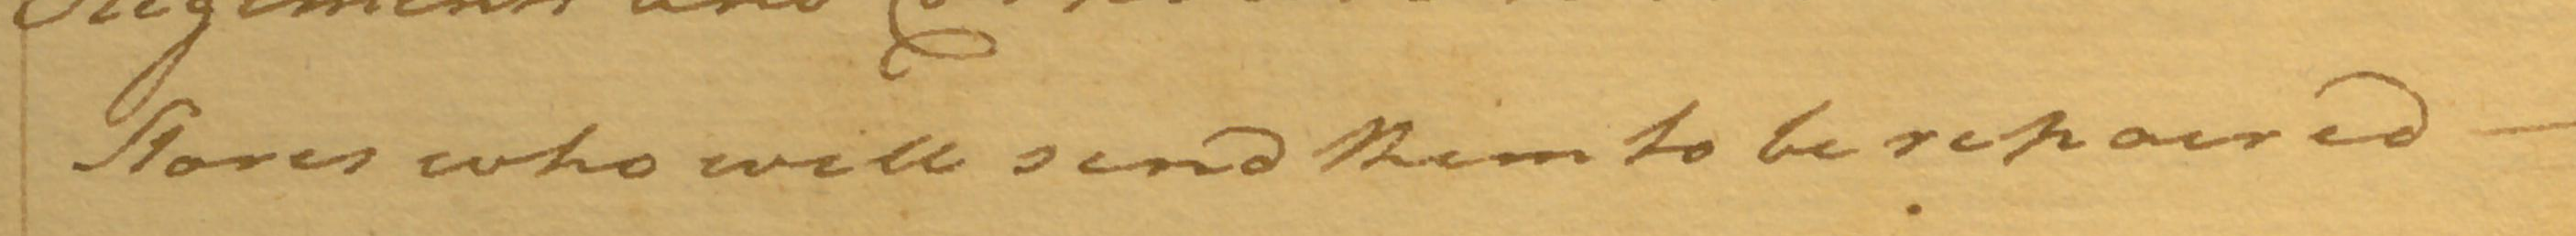stores who will send them to be repaired-
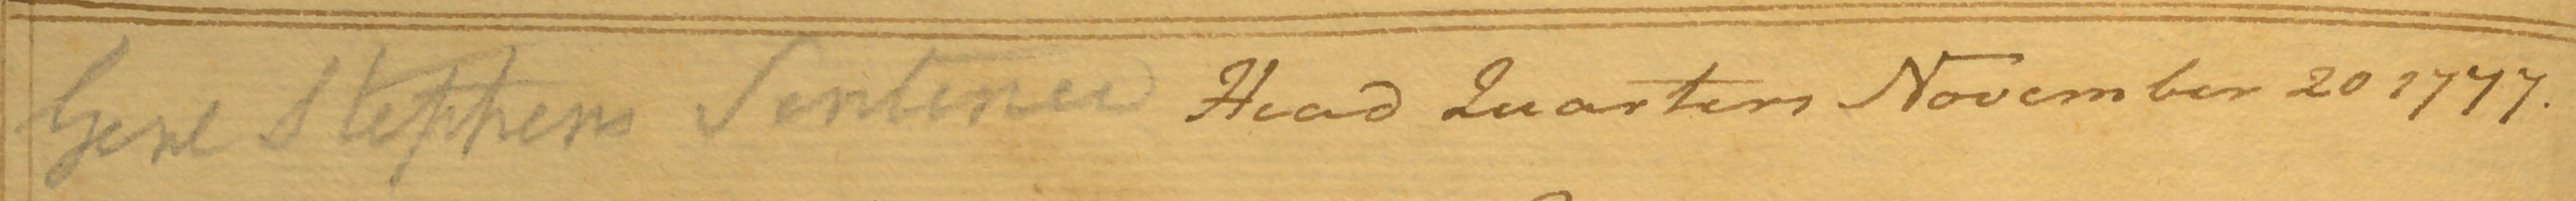Genl Stephens Sentence Head Quarters November 20 1777
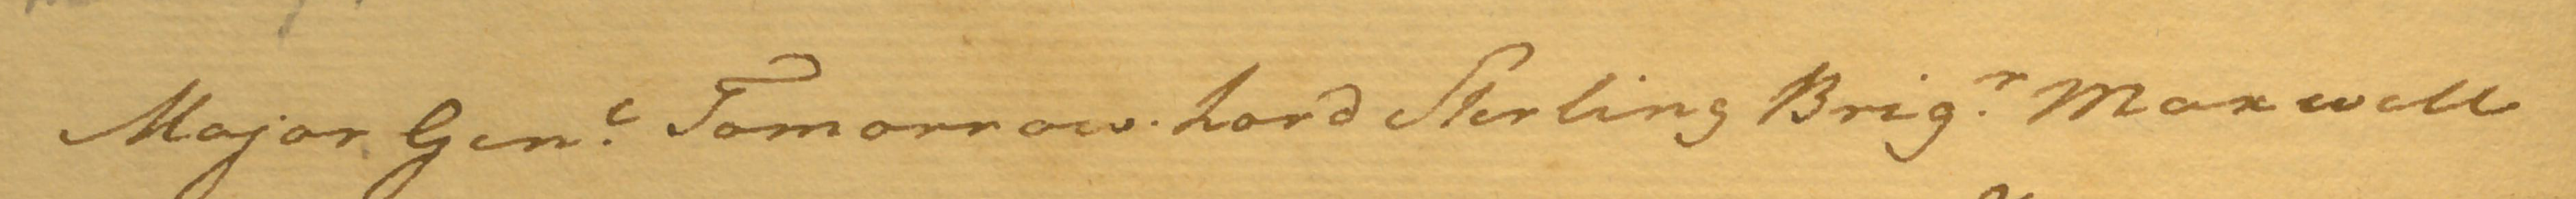Major Gen^l. Tomorrow Lord Sterling Brig^r. Maxwell
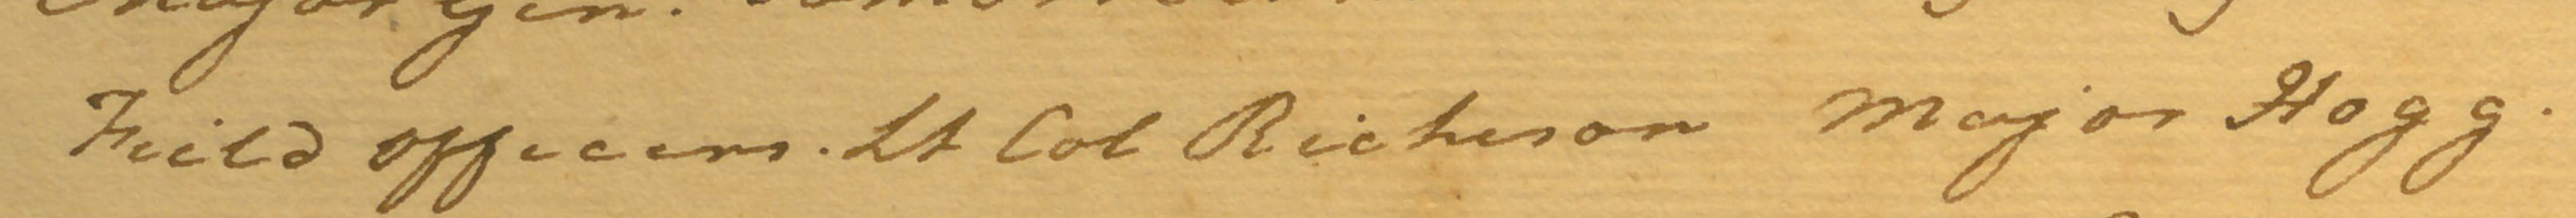Field Officers. Lt Col Richeson Major Hogg
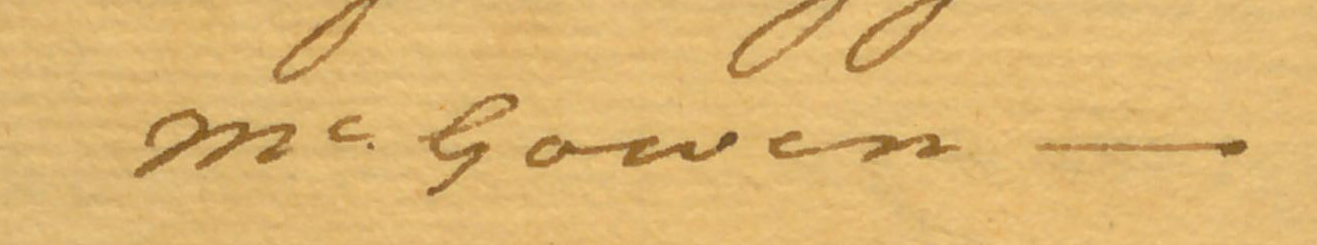M^cGowen-
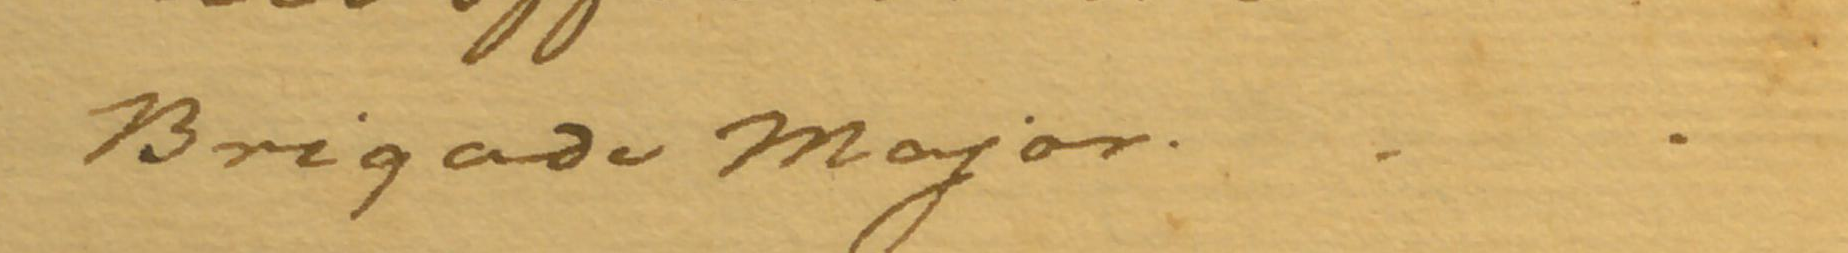Brigade Major. ..
